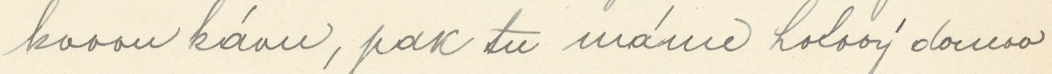kovou kávu, pak tu máme hotový domov -
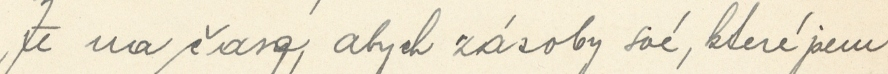Je na čase, abych zásoby své, které jsem
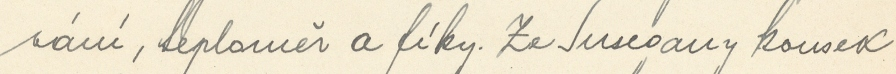vání, teploměr a fíky. Ze Susegany kousek
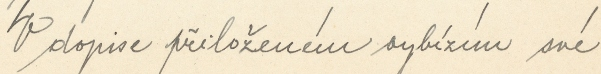V dopise přiloženém vybízím své
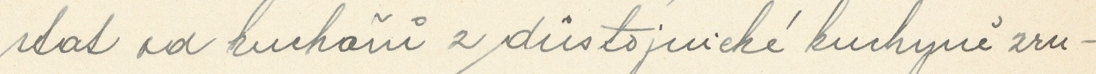stat od kuchařů z důstojnické kuchyně zrn-
